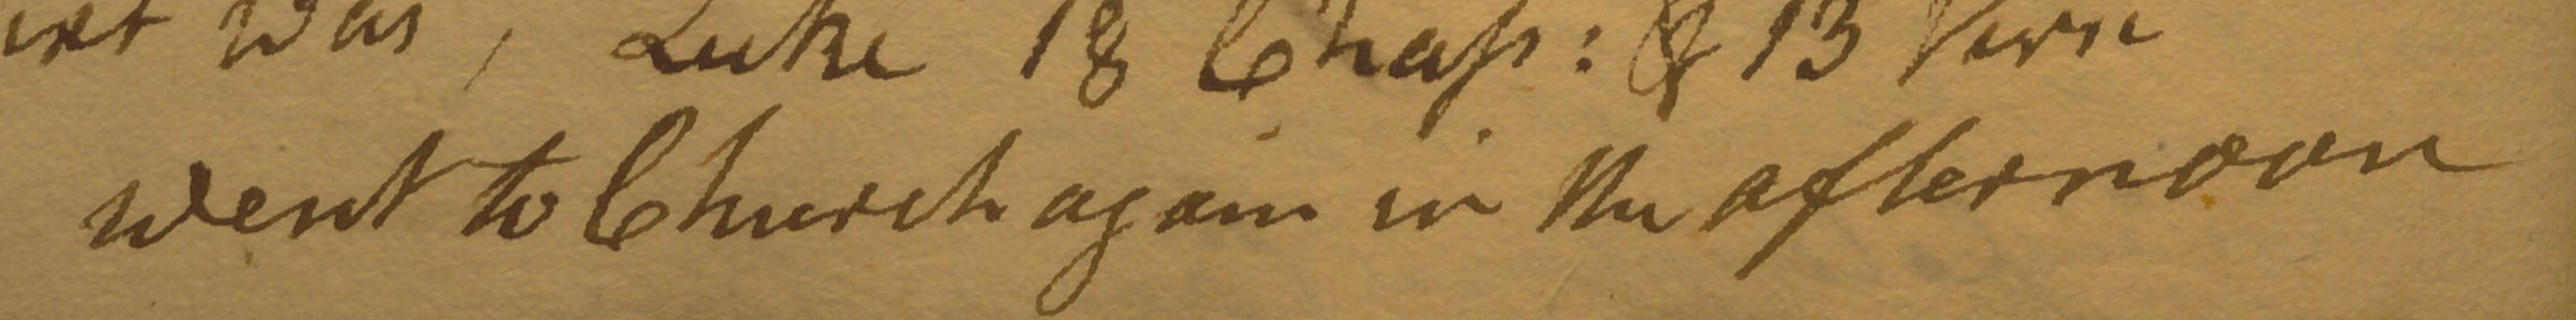went to Church again in the afternoon
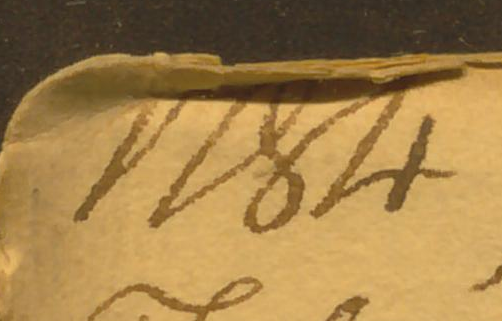1784
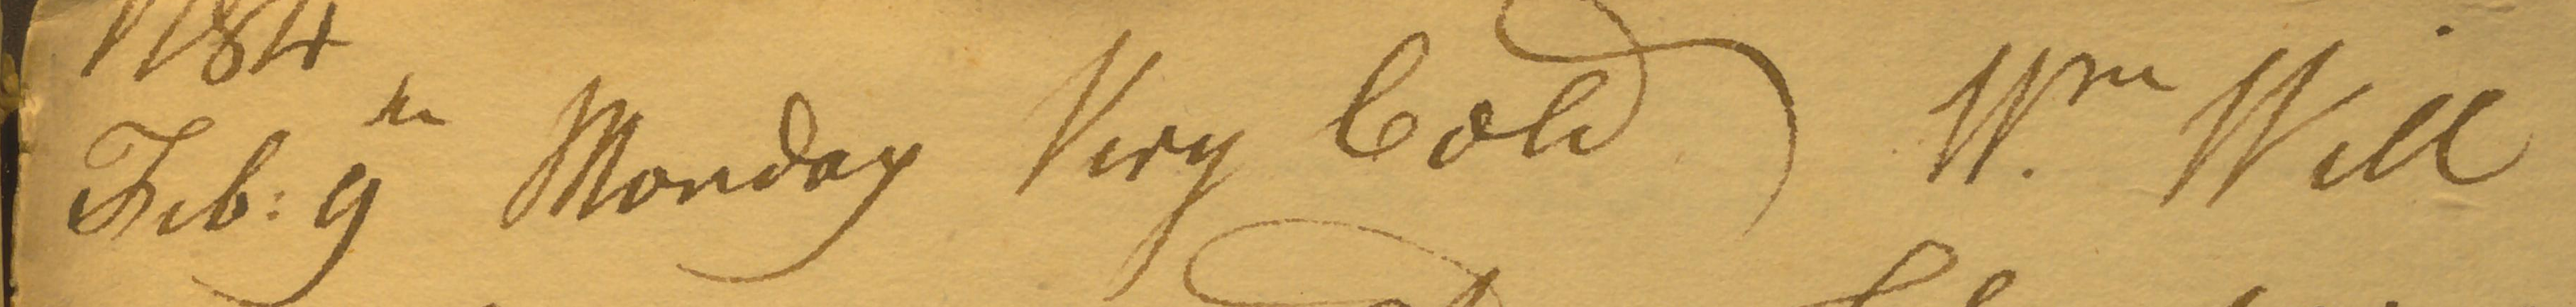Feb: 9th Monday Very Cold W^m Will
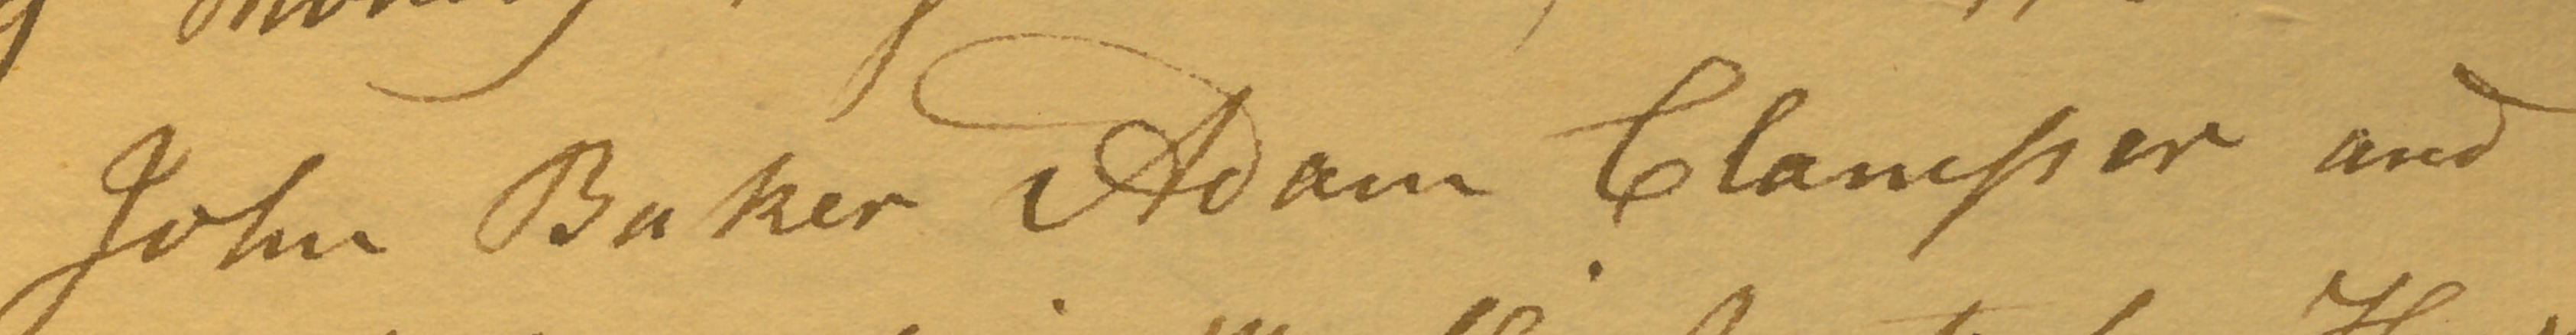John Baker Adam Clamper and
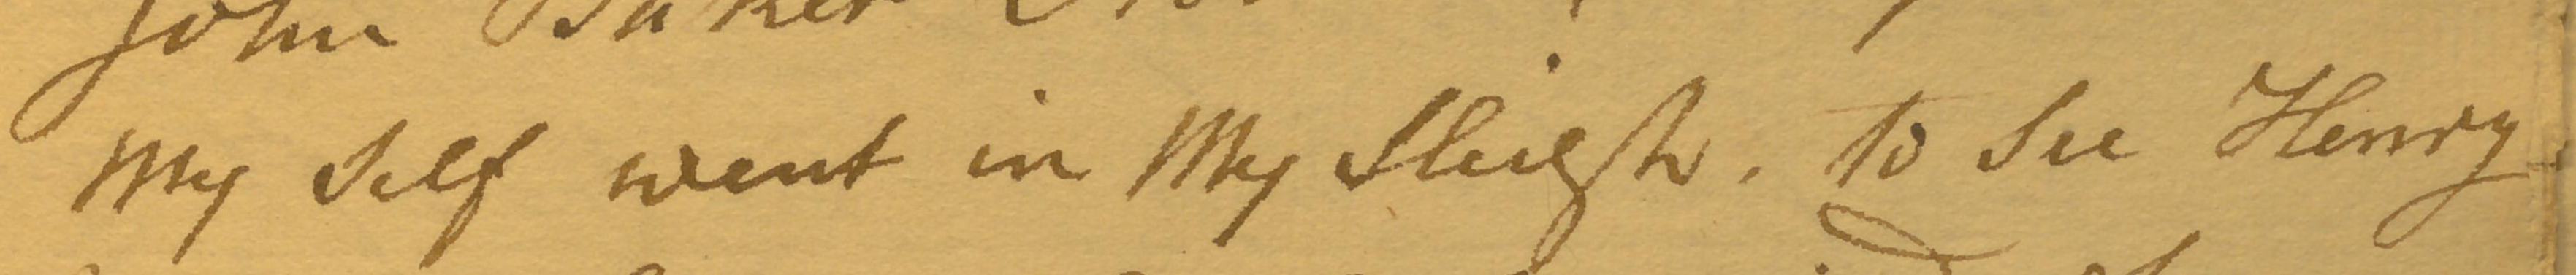My self went in My Sleigh, to see Henry
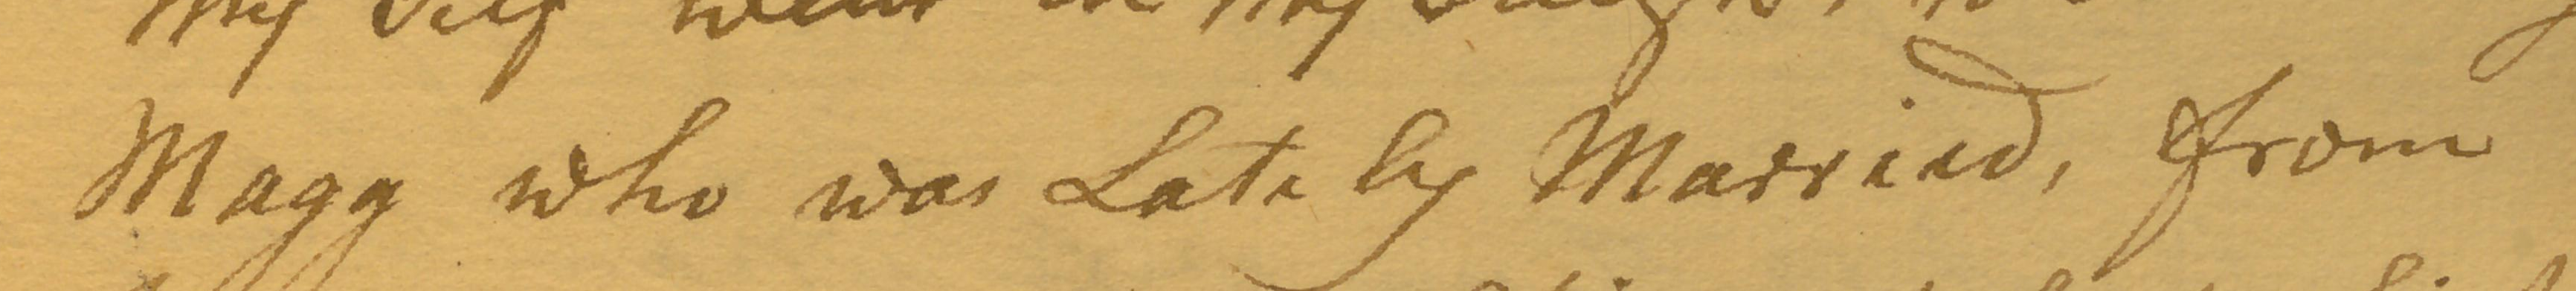Magg who was Lately Married, from
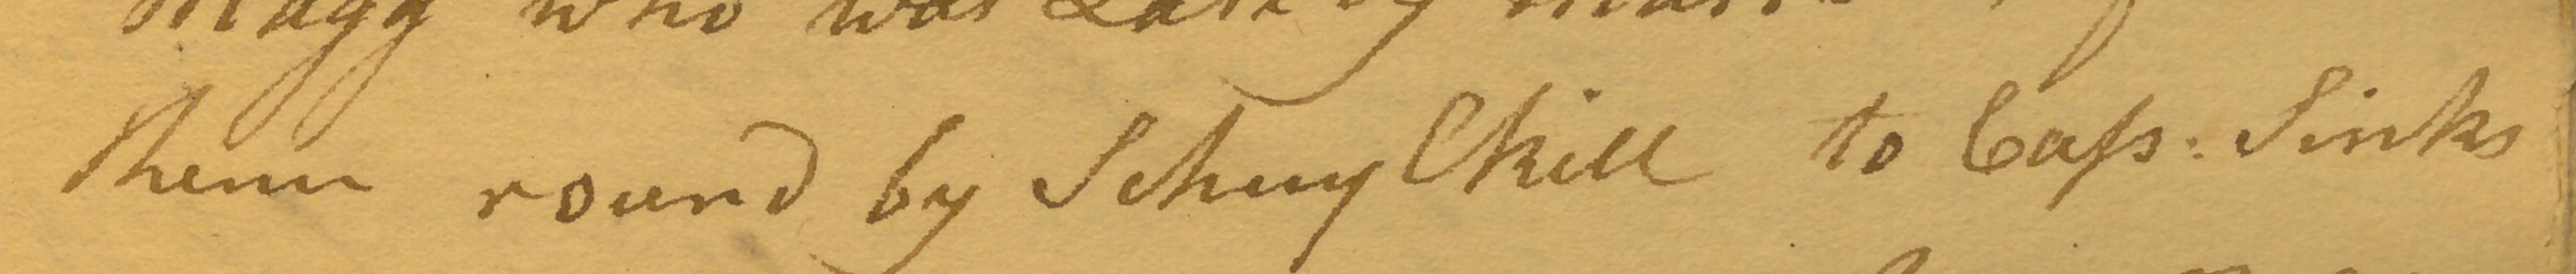thence round by Schuylkill to Cap: Sinks
